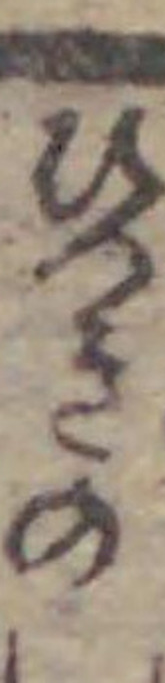ひつきの
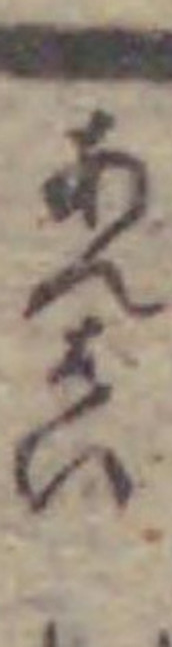あんはい
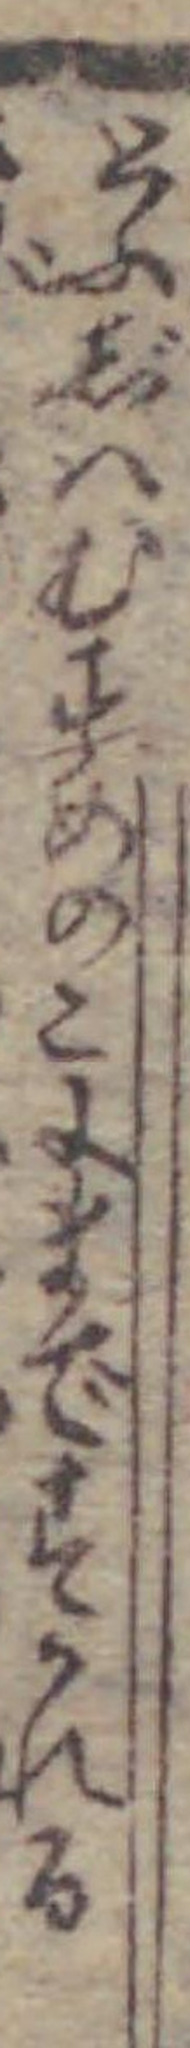とふじへむすめのこにまですかれる
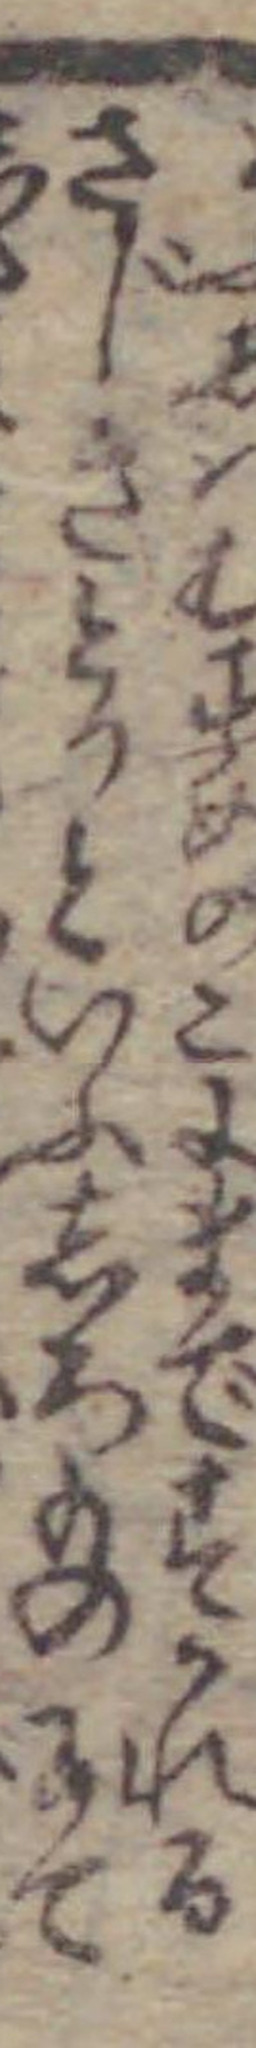さじきとりといふしろものにて
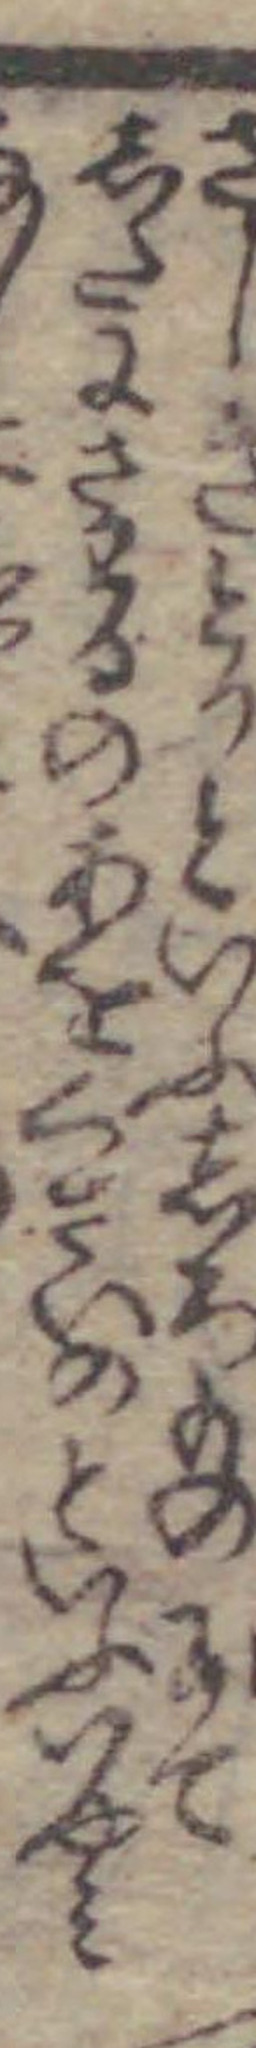したにさわるのあをくさいのといふいやみ
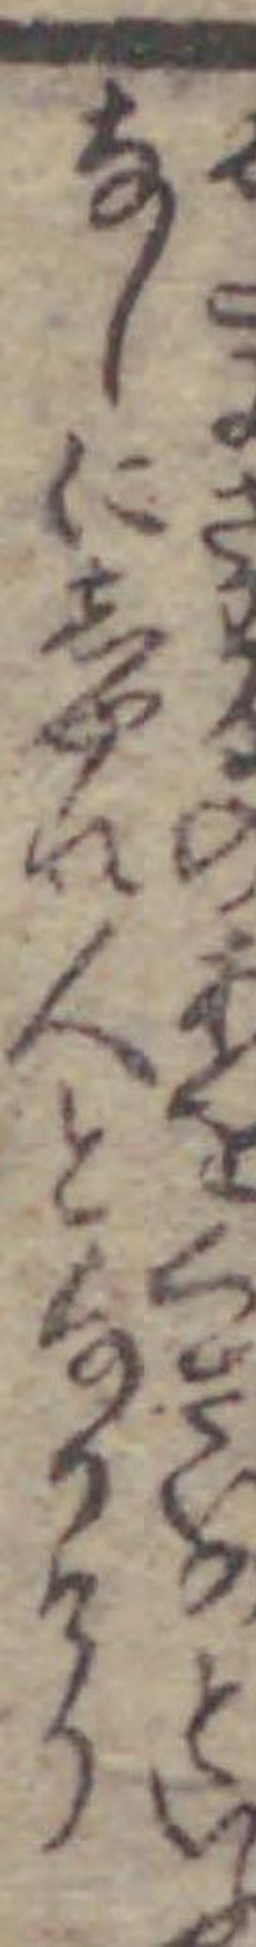なしにしやれ人となりけり
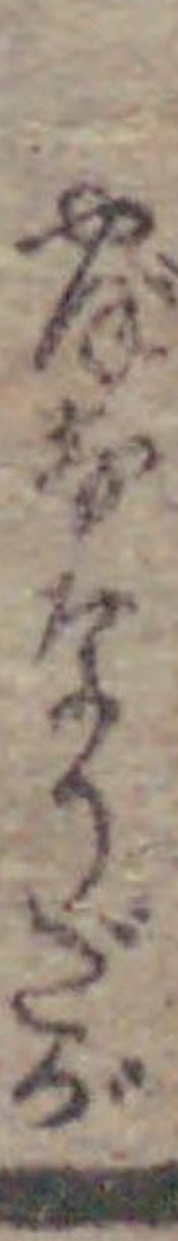やぼなりだが
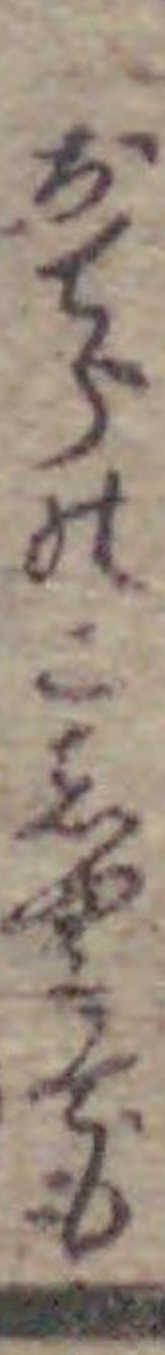おてらのこしやうでも
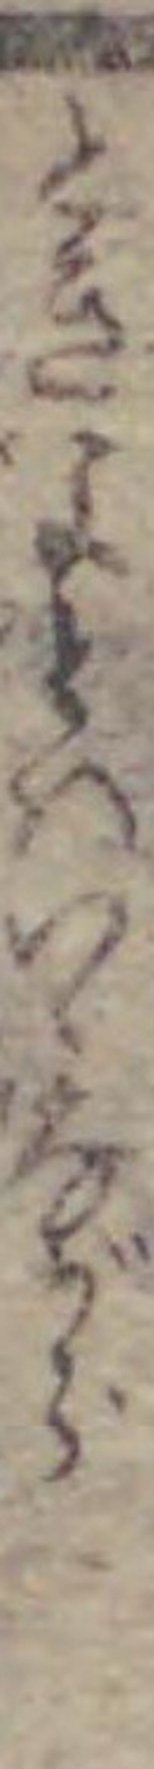ときよとはいゝながら
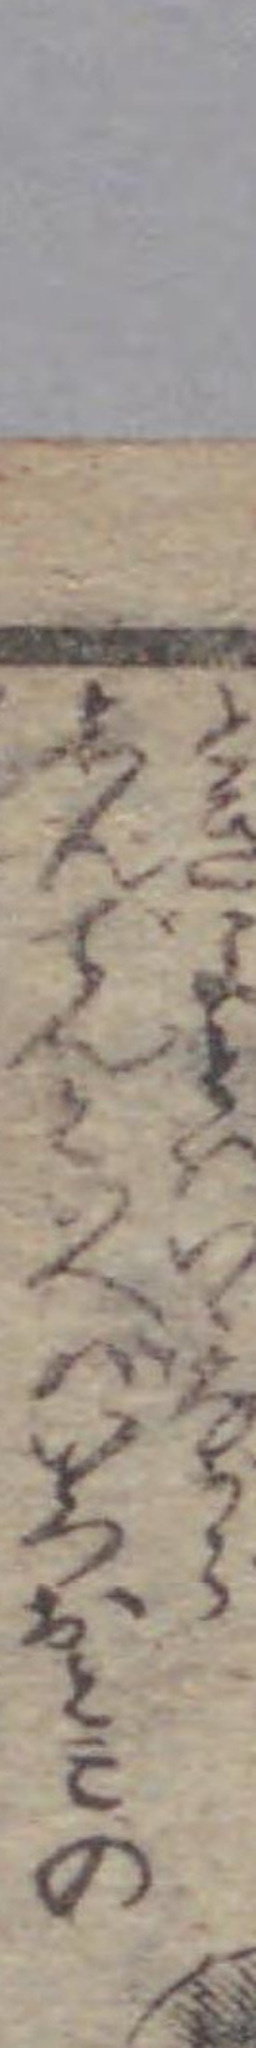しんてんといへばいろおとこの
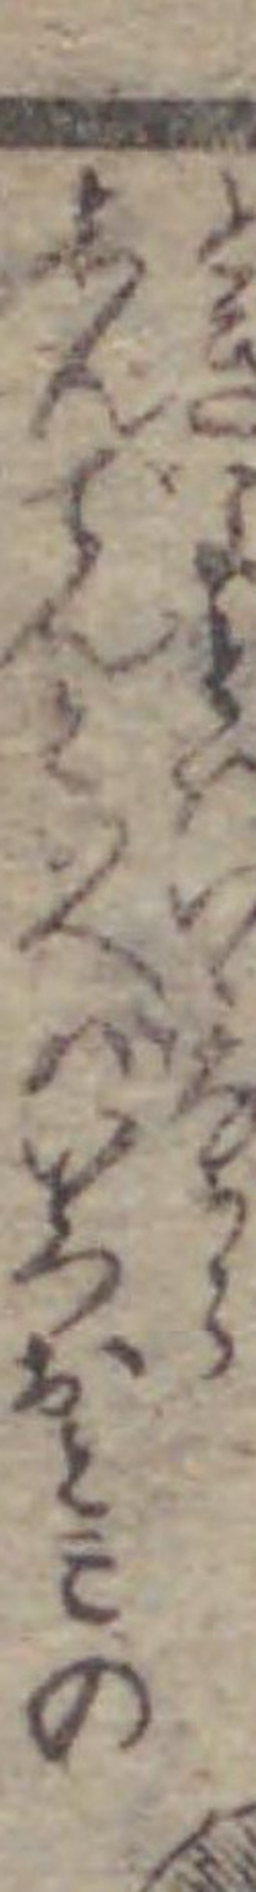しんてんといへばいろおとこの
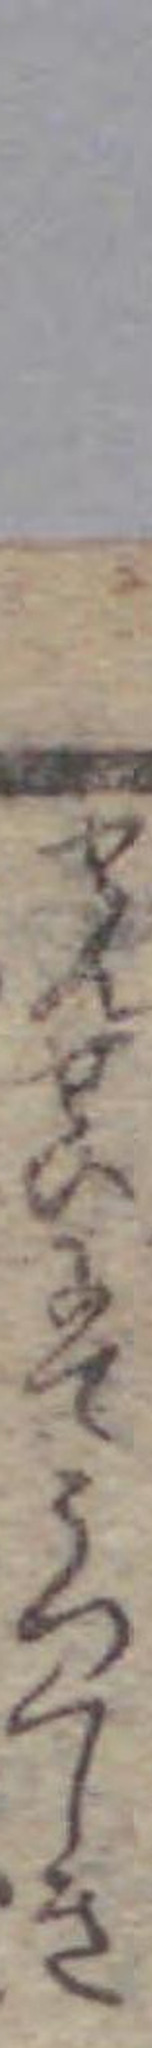せんせいにてうつくしき
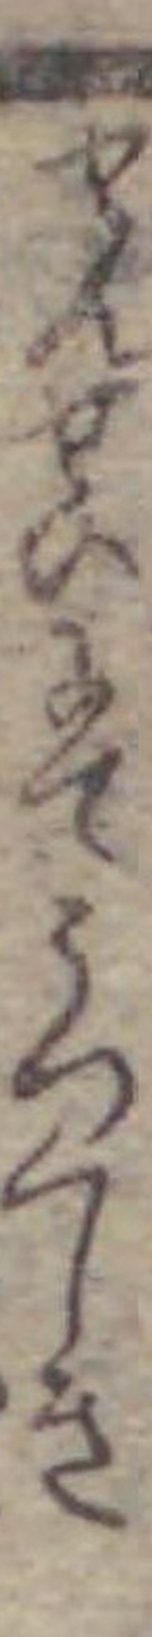せんせいにてうつくしき
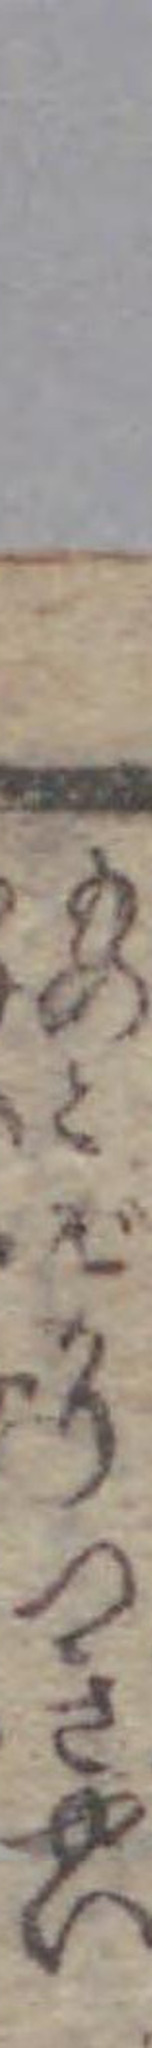ものとばかりつきやい
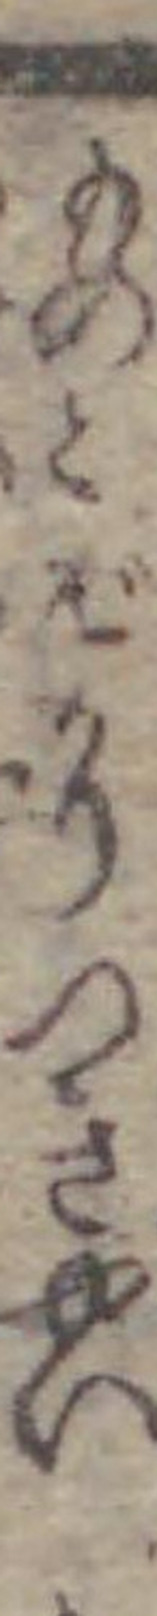ものとばかりつきやい
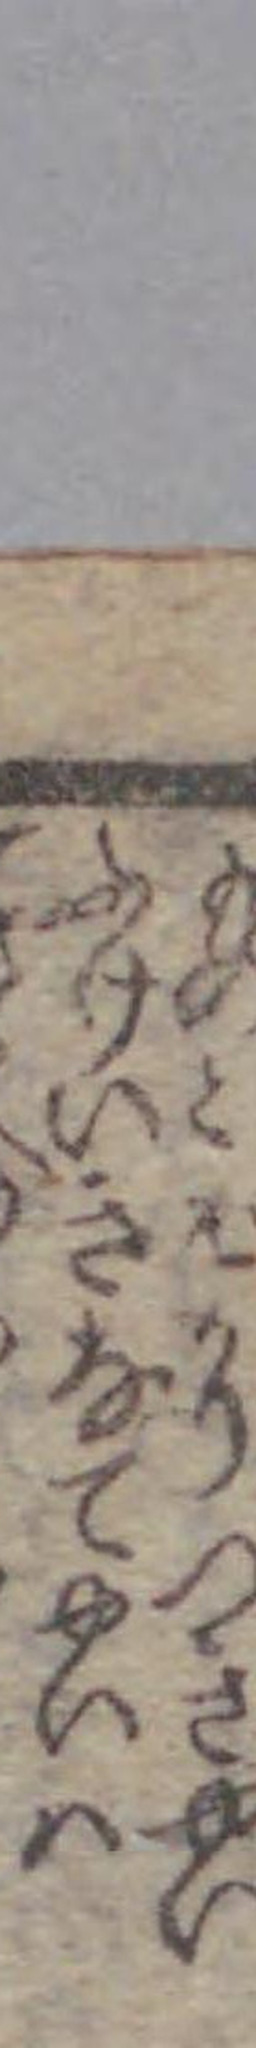ふけいきなてやいは
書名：談芭菰誉詞 : 3巻
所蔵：国立国会図書館 National Diet Library, JAPAN
